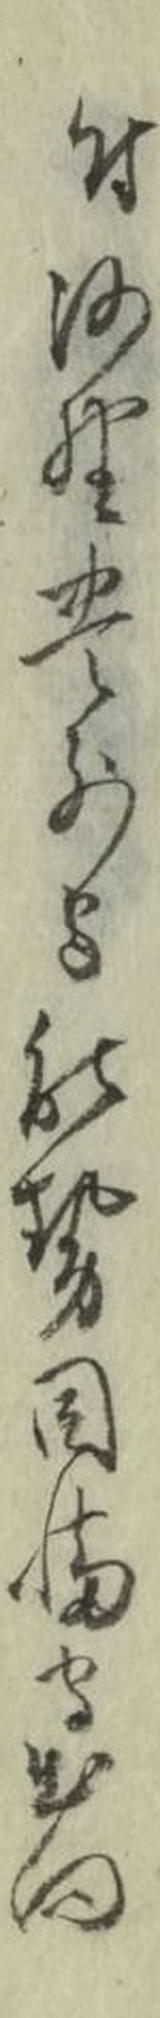付河野豊前守能勢因幡守出向
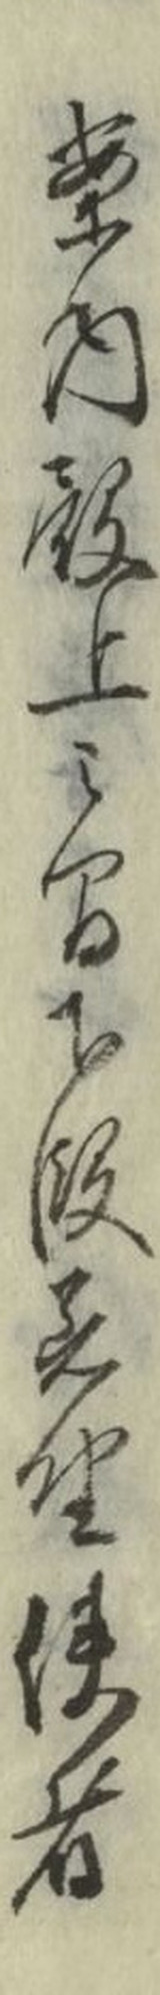案内殿上之間下段着坐使者
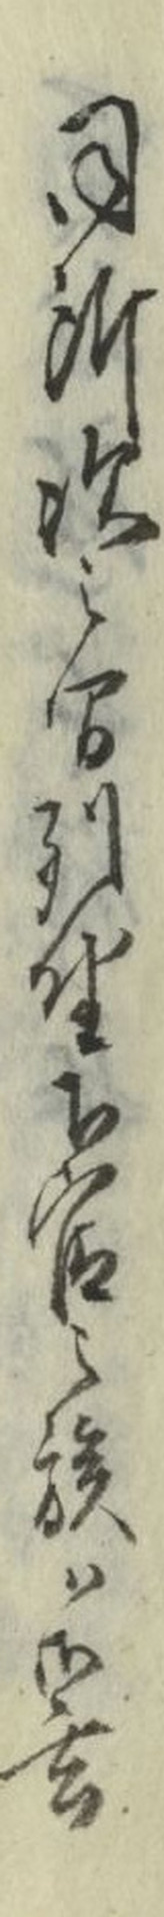同所次之間列坐下官之族は御玄

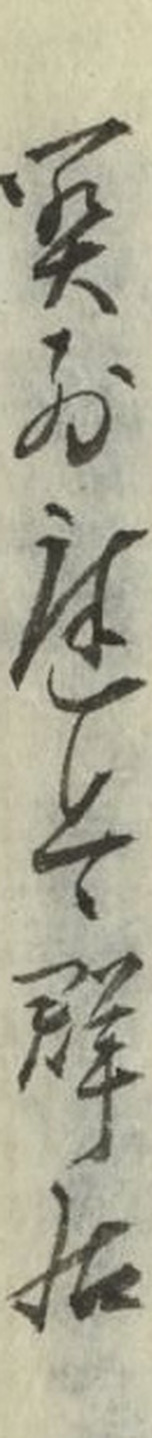関前庭上に群居
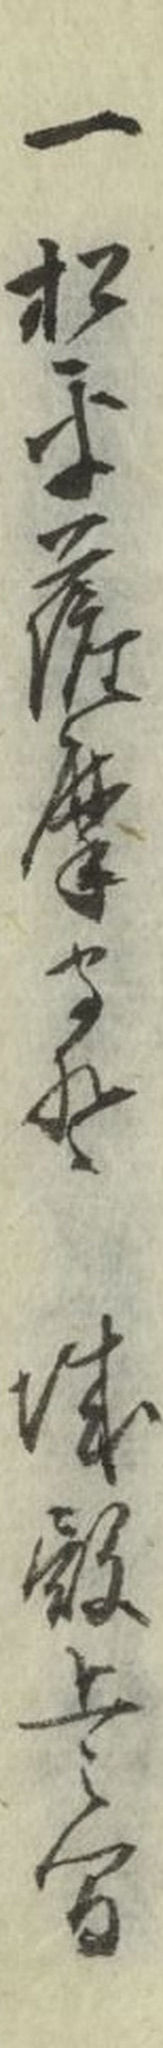一松平薩摩守登城殿上之間
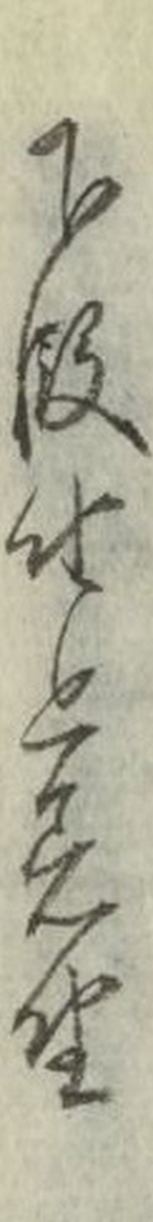下段坐上着坐
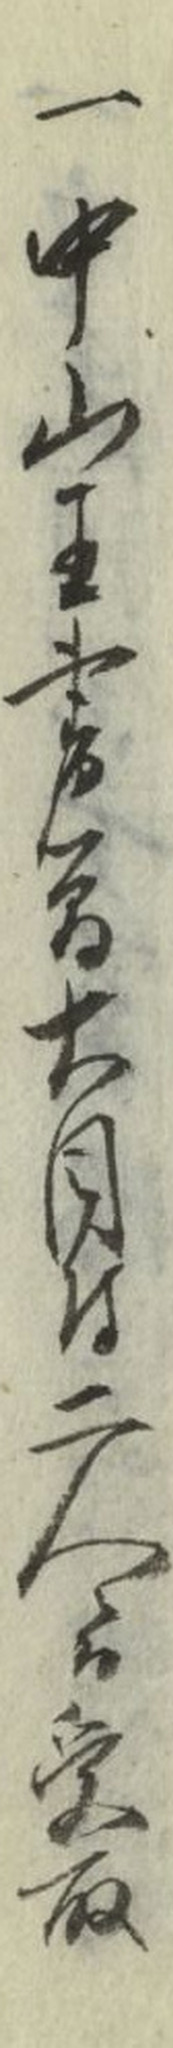一中山王書簡大目付二人に而受取
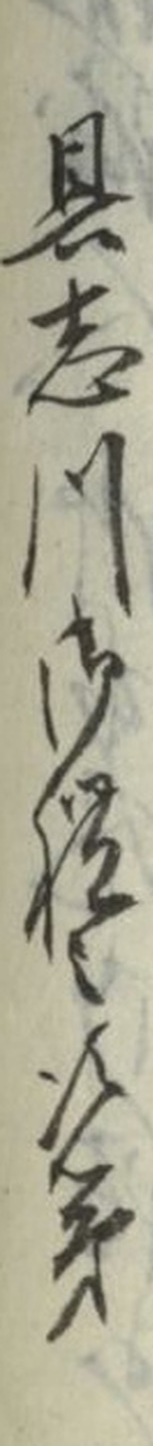具志川御礼之次第
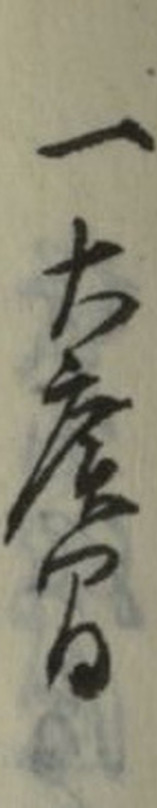一大広間
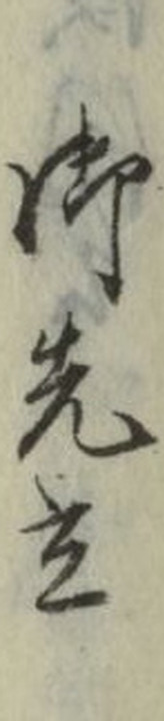御先立
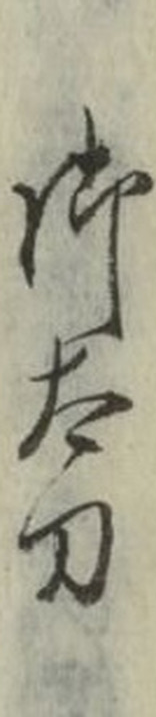御太刀

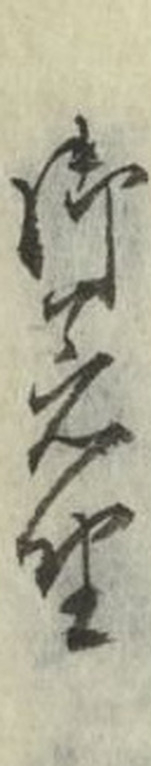御着坐
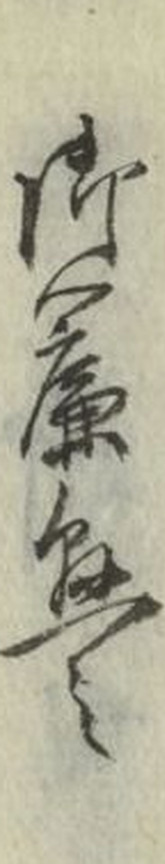御簾懸之
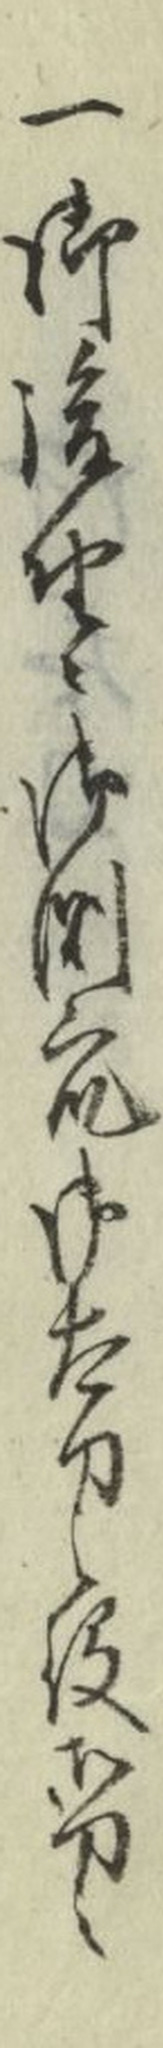一御後坐に御側衆御太刀之役御刀之
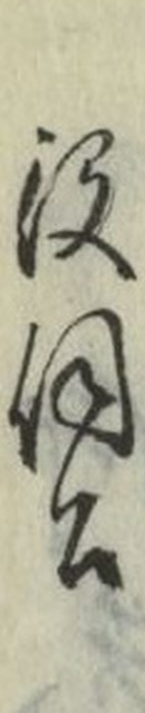役伺公
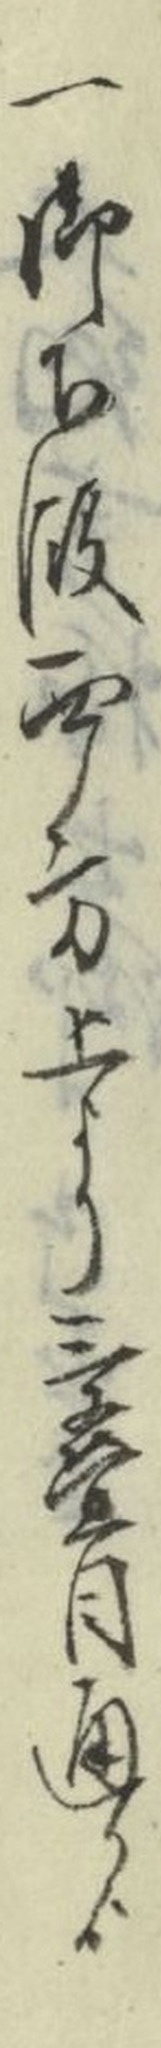一御下段西の方上より三畳目通りゟ
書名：琉球人来朝記 三
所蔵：University of the Ryukyus Library
